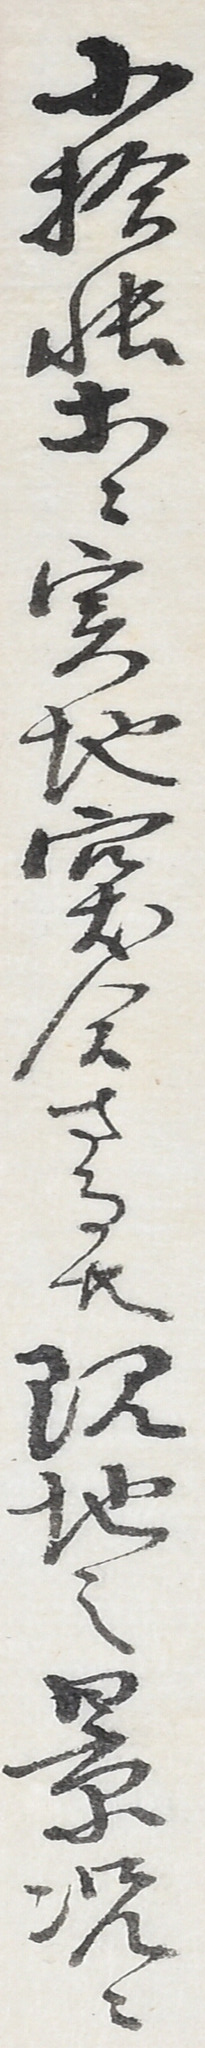小拾帳等ニ実地突合さる共現地之景況ニ
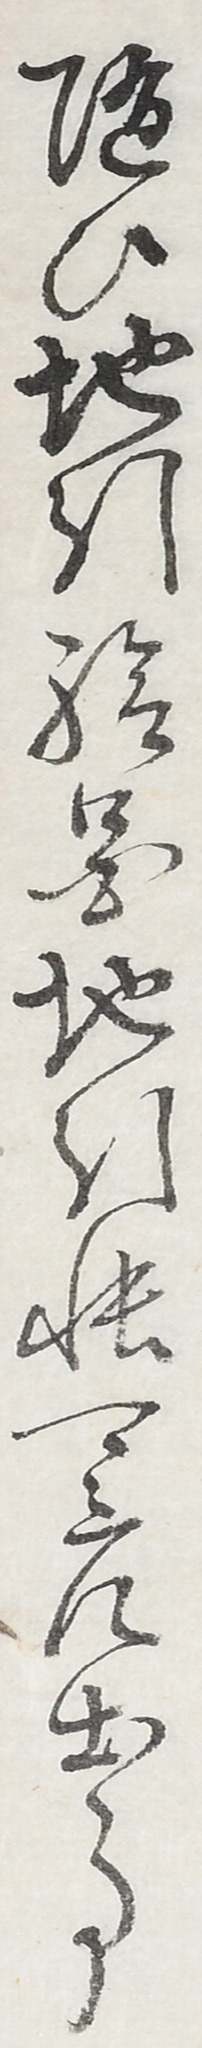随ひ地引絵図地引帳可差出事
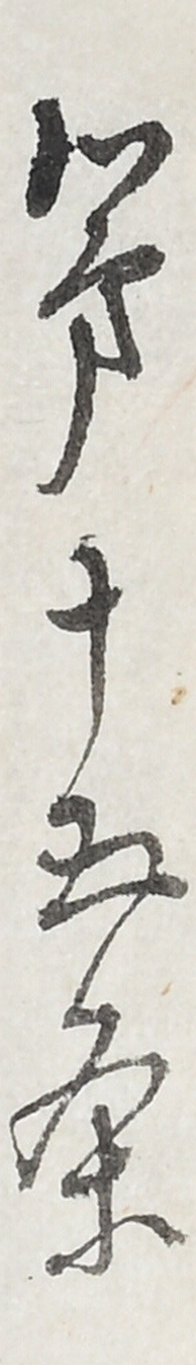第十五条
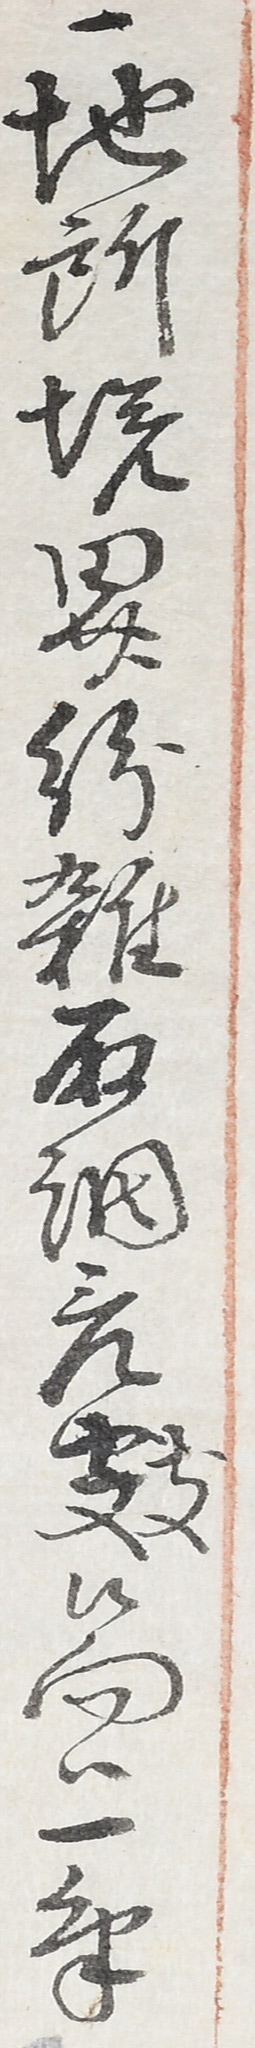一地所境界粉雑取調差支候向は一筆
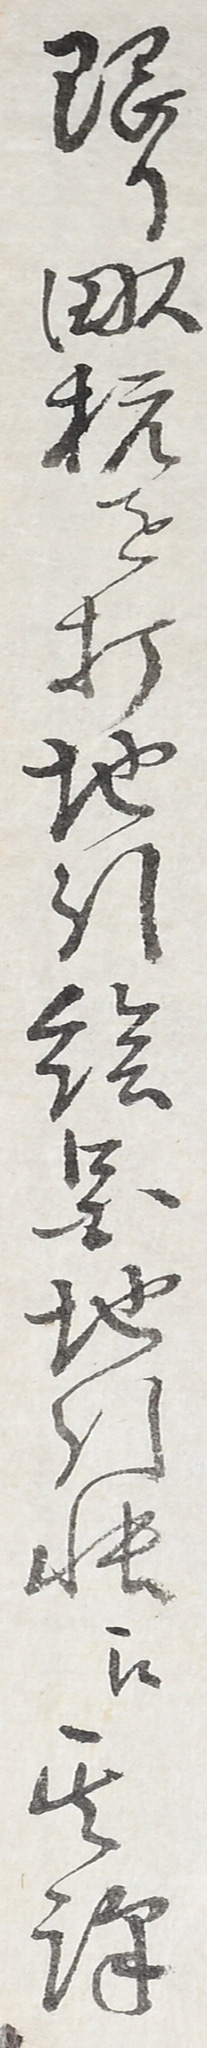限り畝杭を打地引絵図地引帳え其訳
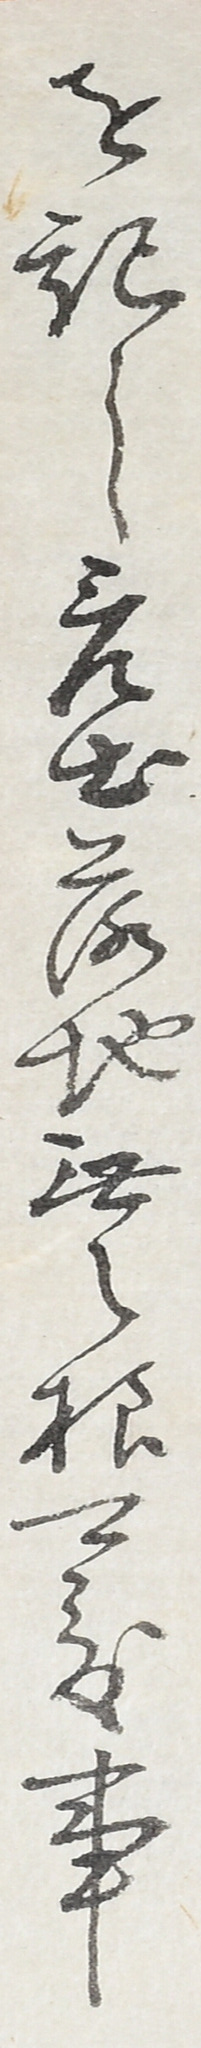を記し差出落地無之様可致事

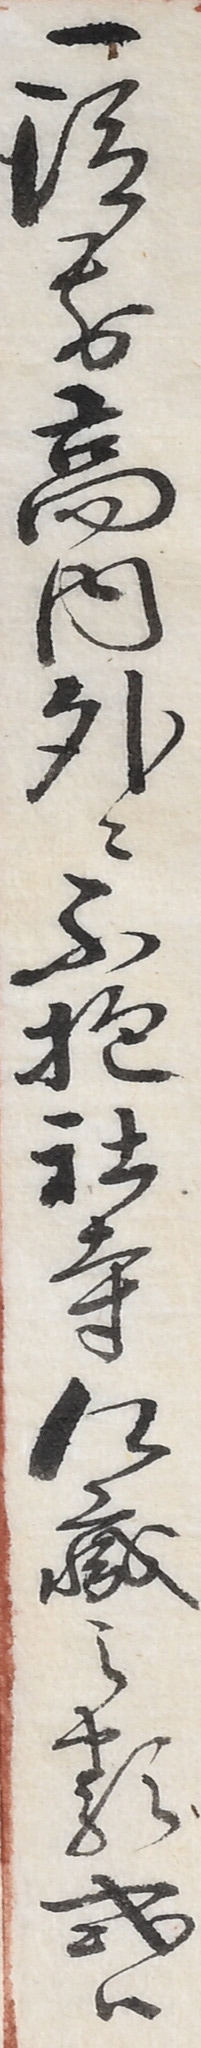一従前高内外ニ不抱社寺郷蔵之類或ハ
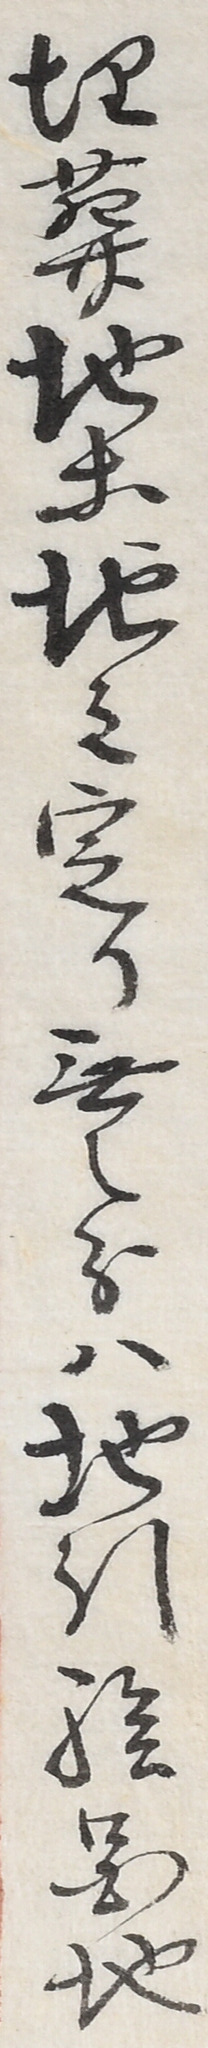埋葬地等地主定り無之分ハ地引絵図地
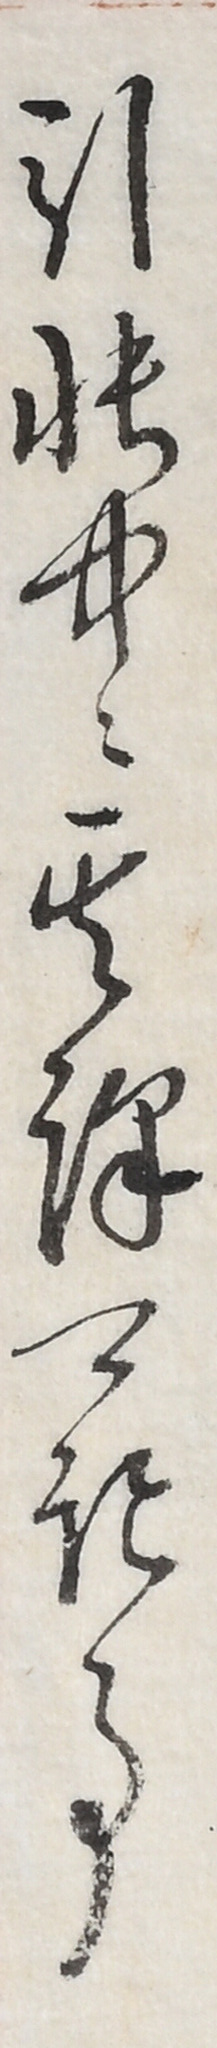引帳中ニ其訳可記事
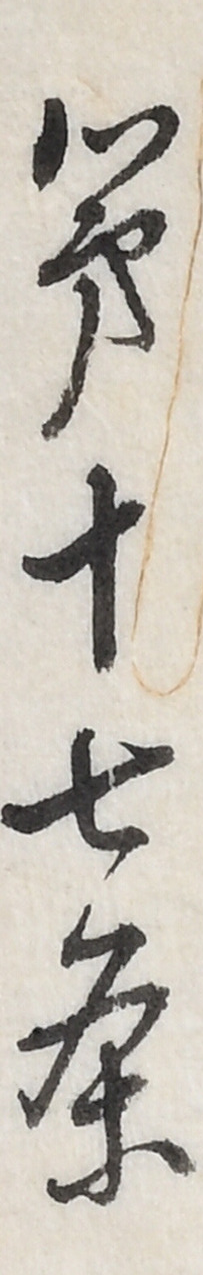第十七条
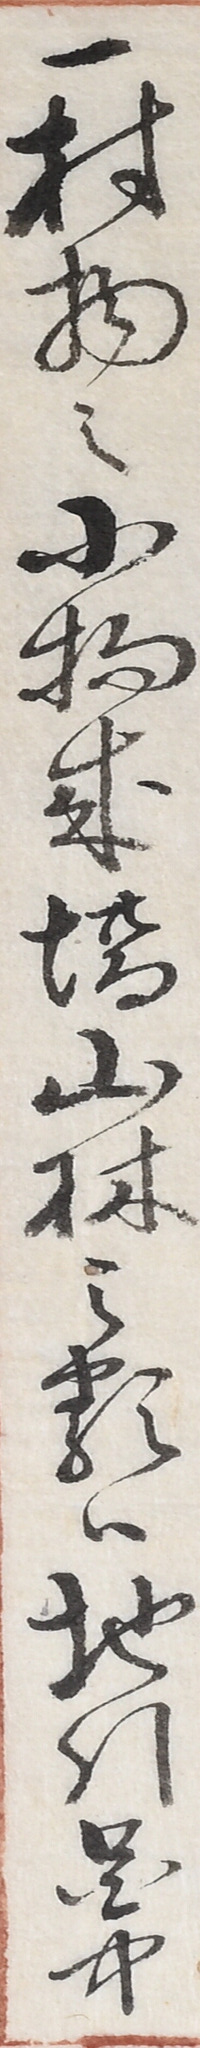一村物之小物成場山林之類ハ地引図中
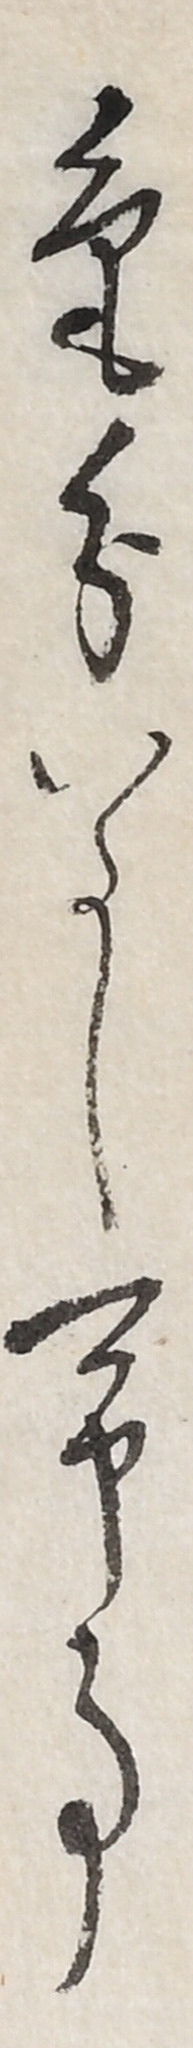色分いたし可申事
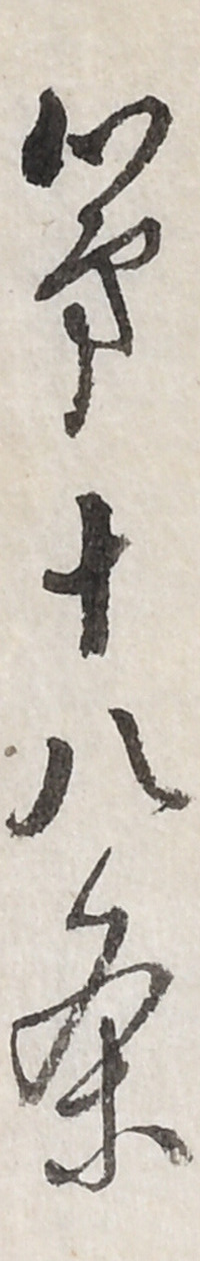第十八条
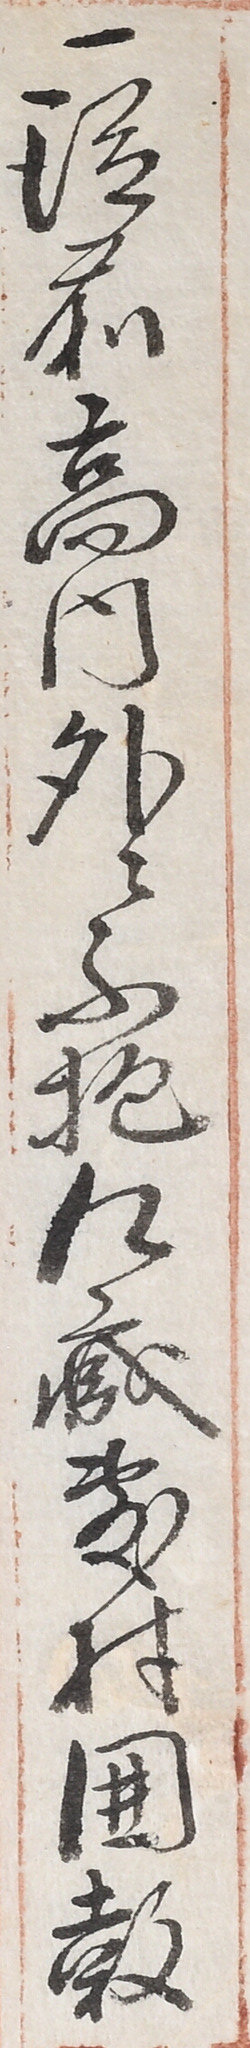一従前高内外ニ不抱郷蔵敷村囲穀
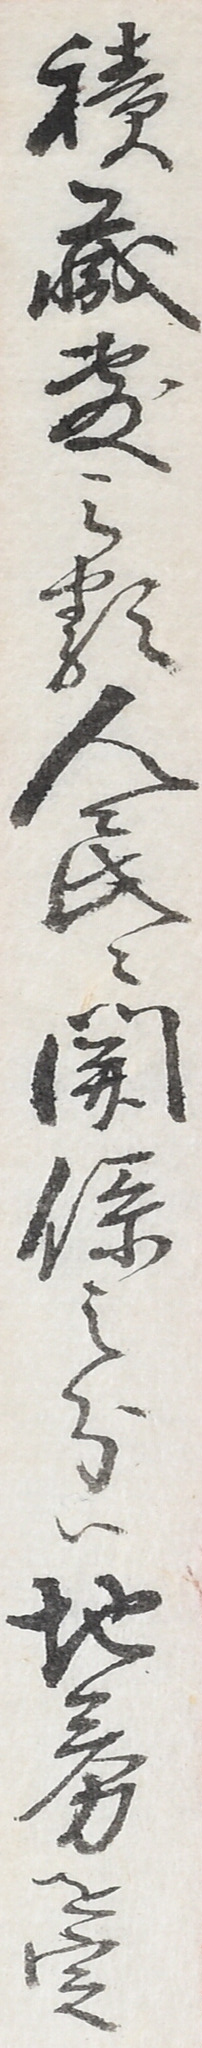積蔵敷之類人民ニ関係之分ハ地券を定
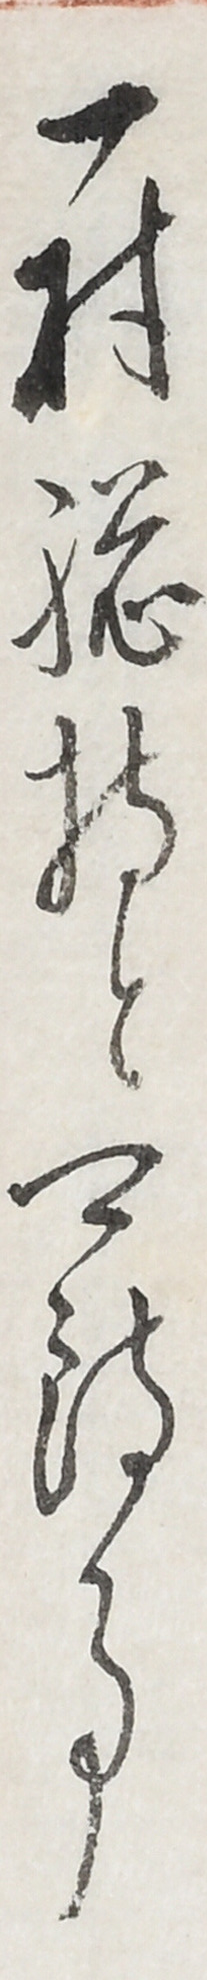一村総持と可致事
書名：壹番・御布告一式
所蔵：伊那市立高遠町図書館・合同会社AMANE
